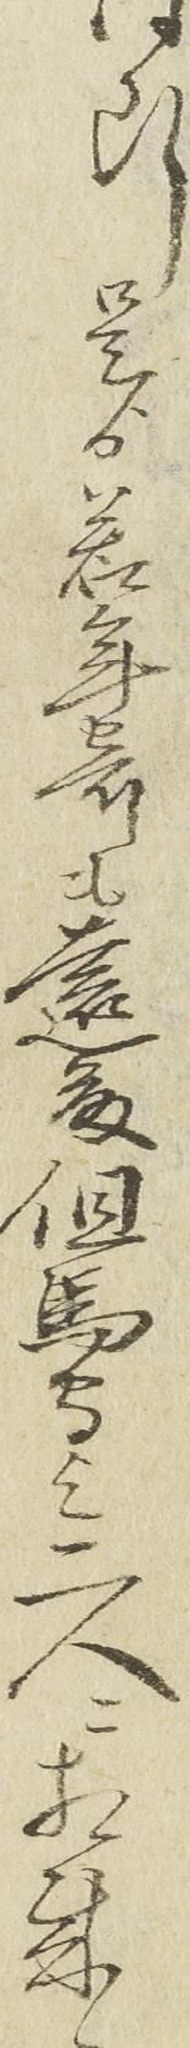同断是ゟ若年寄も遠藤但馬守と二人ニ相成候
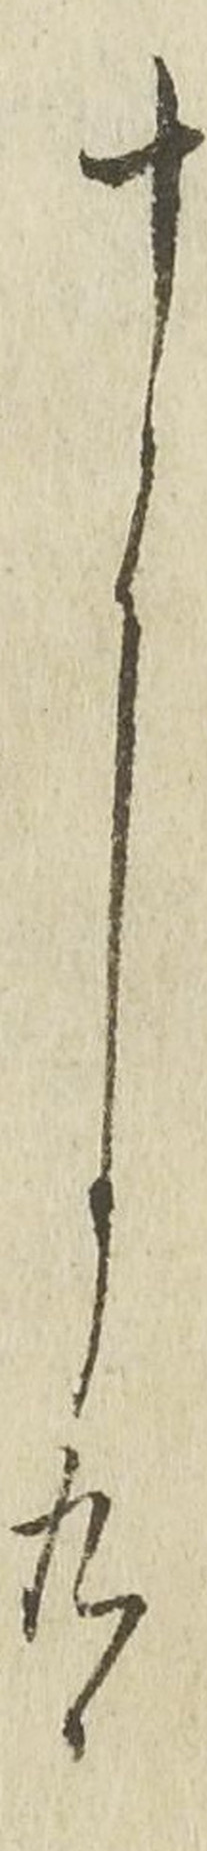十月九日
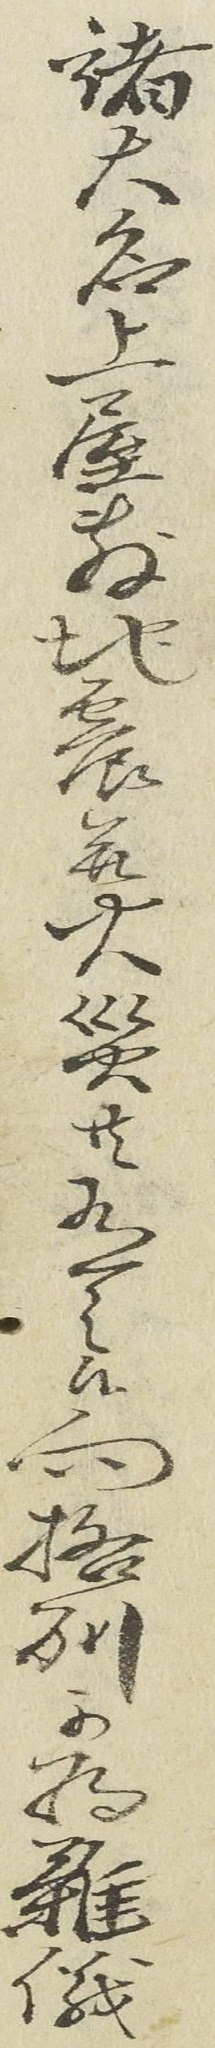諸大名上屋敷地震幷火災共有之候向格別可為難儀
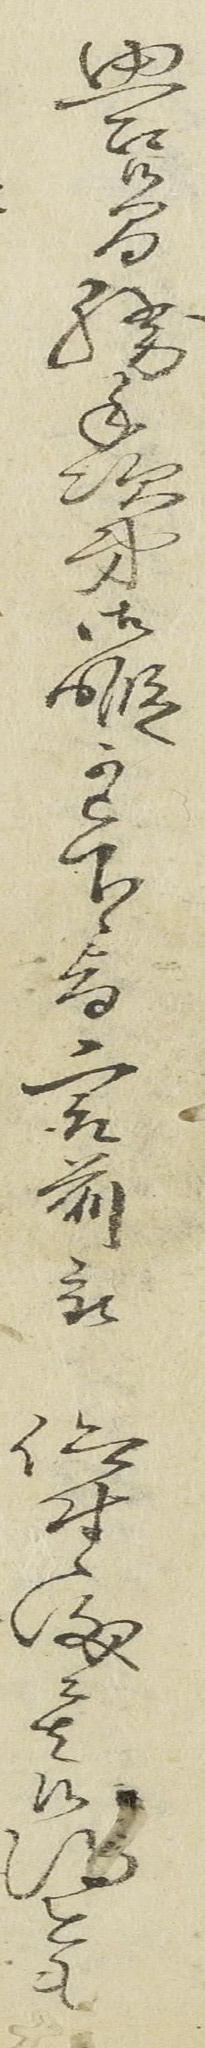思召候間勝手次第御暇可被下候旨最前被仰付候儀には候得とも
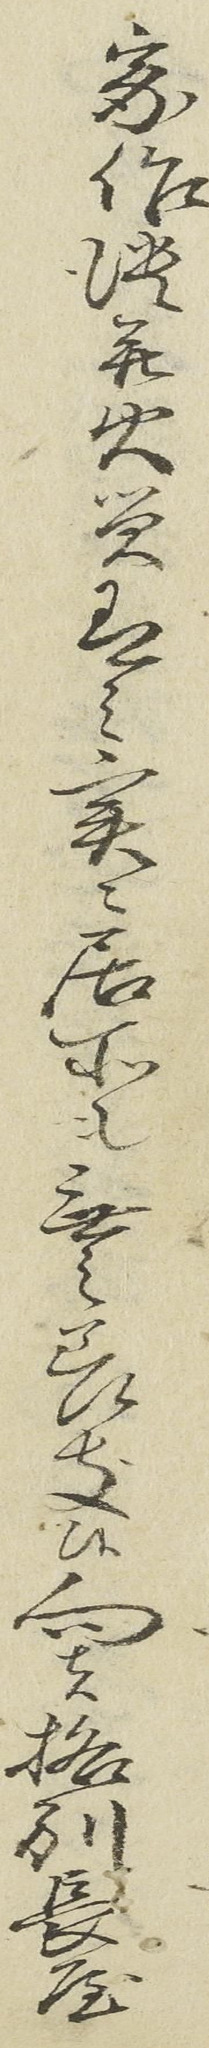家作潰幷火災有之実二居所も無之差支候向は格別長屋

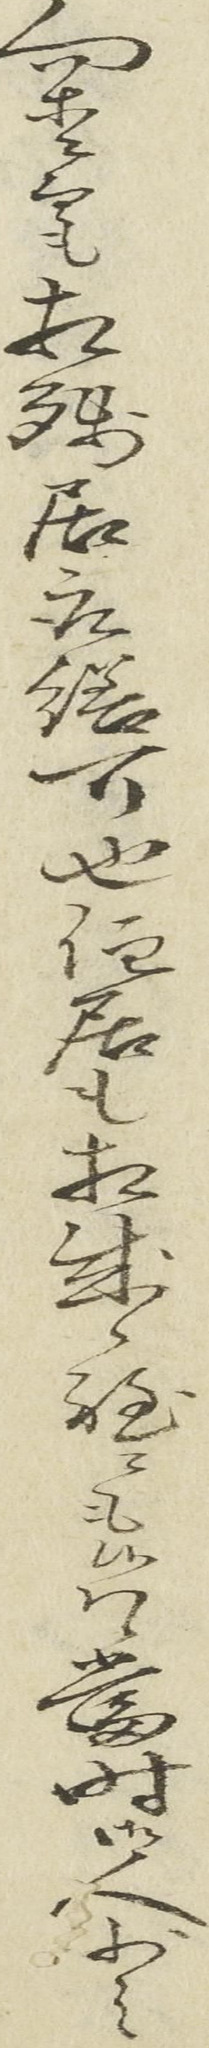向等ニ而も相残居取繕可也住居も相成候程にも候ハゝ当時御人少し
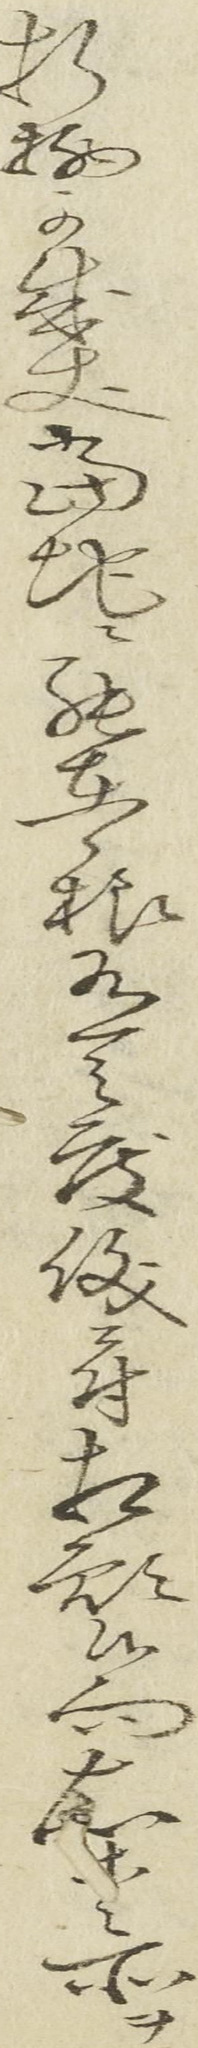折柄可成丈当地ニ罷在候様有之度儀ニ付相願候向右等の所ヲ
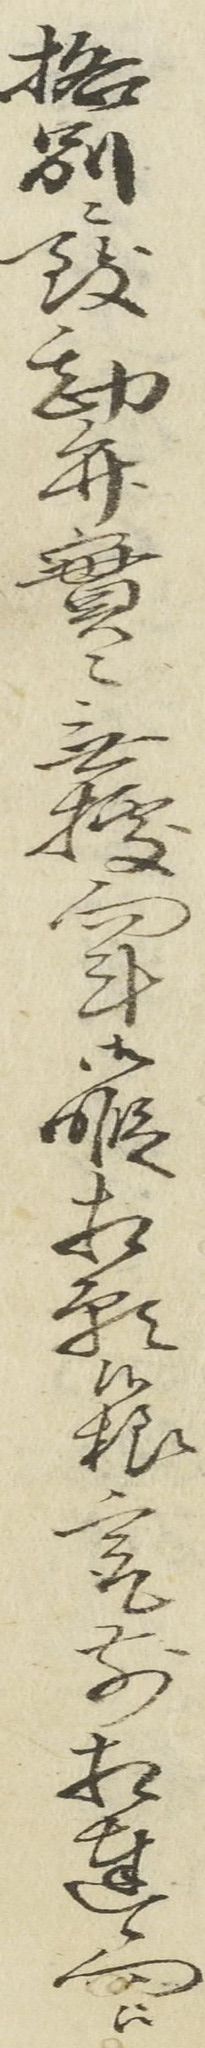格別二致勘弁実二無拠向き斗御暇相願候様最前相達候向え
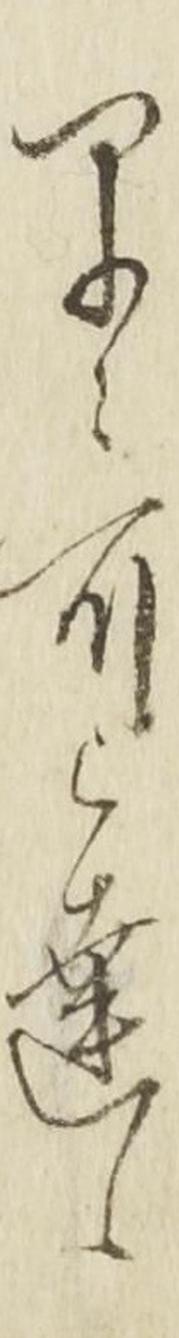早々可被達候
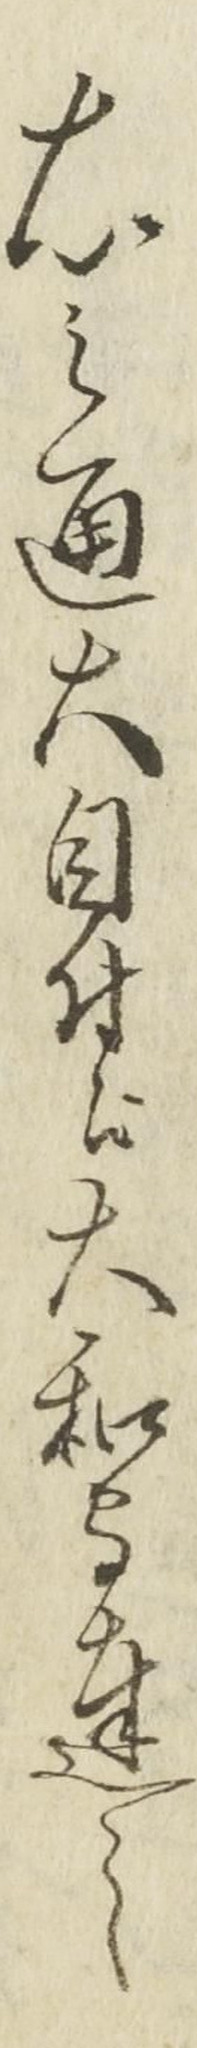右之通大目付ゟ大和守達之
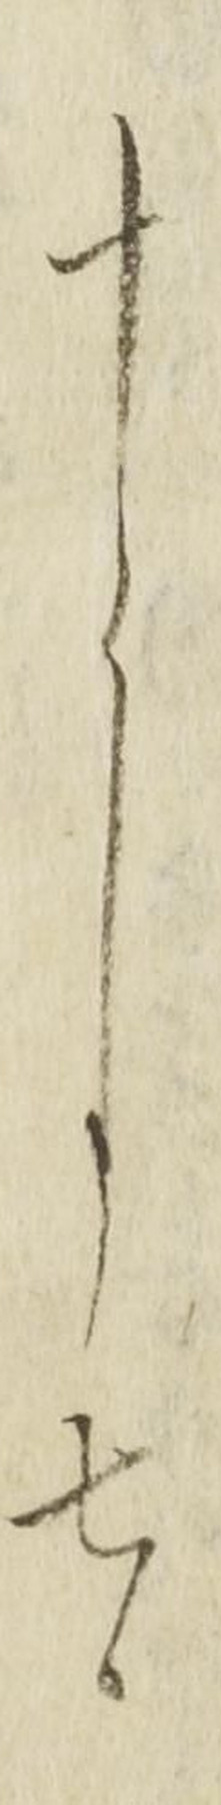十月七日
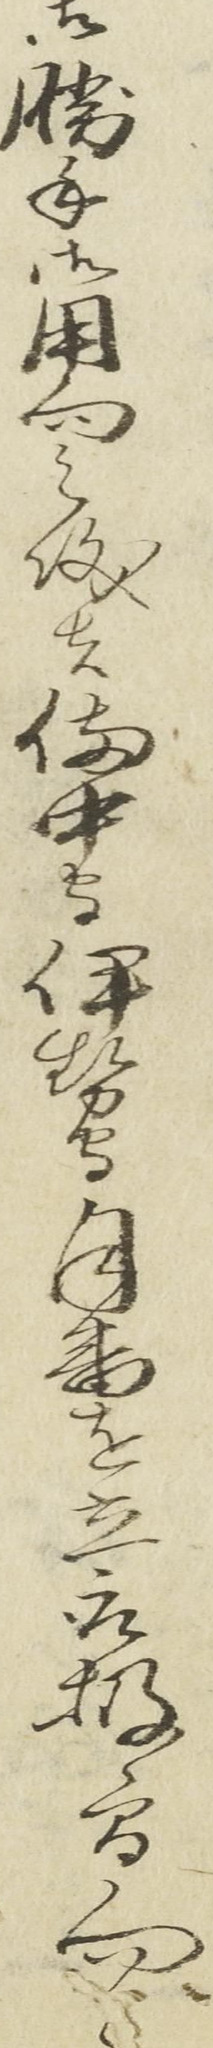御勝手御用向之儀は備中守伊勢守月番を立取扱候間向ハ
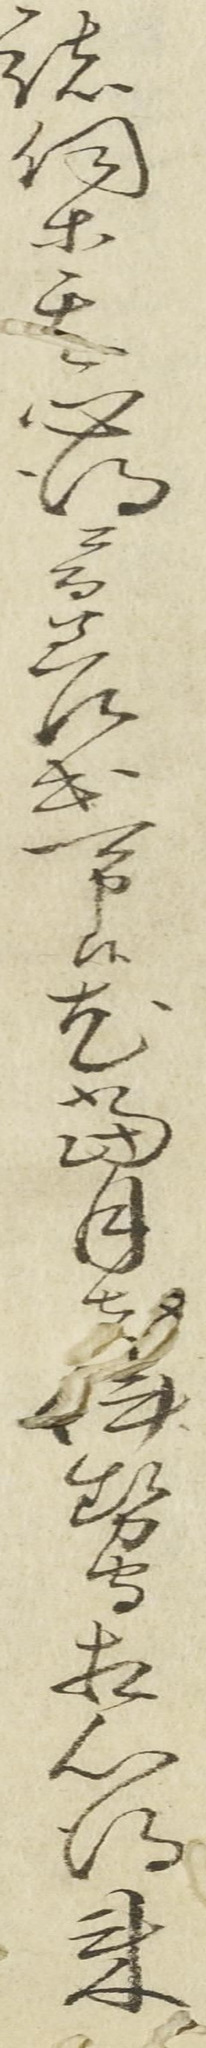諸伺等其心得二而差出可申候尤當月は伊勢守相心得来
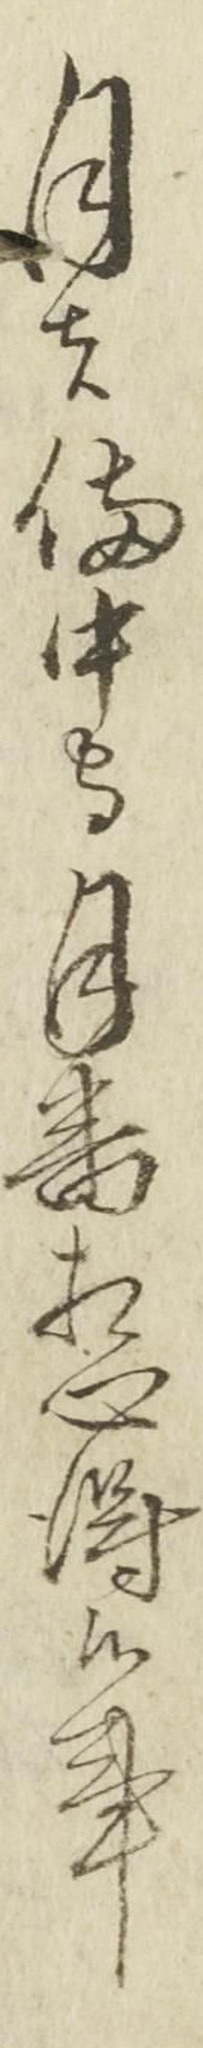月は備中守月番相心得候事
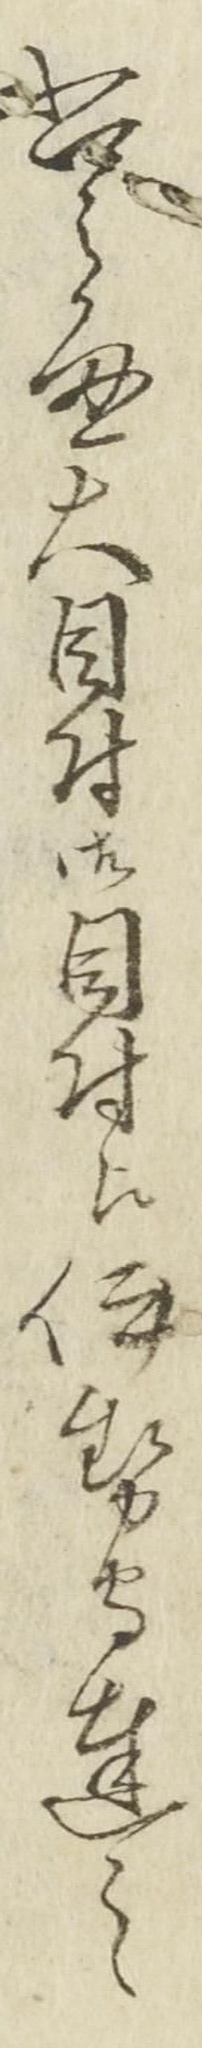右之通大目付御目付え伊勢守達之
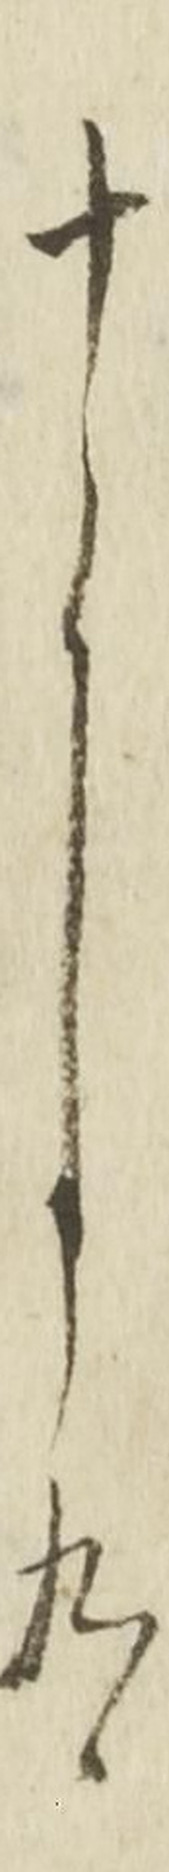十月九日
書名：安政二乙卯年十月二日大地震之事
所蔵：東京大学地震研究所図書室 Earthquake Research Institute Library, The University of Tokyo, JAPAN
